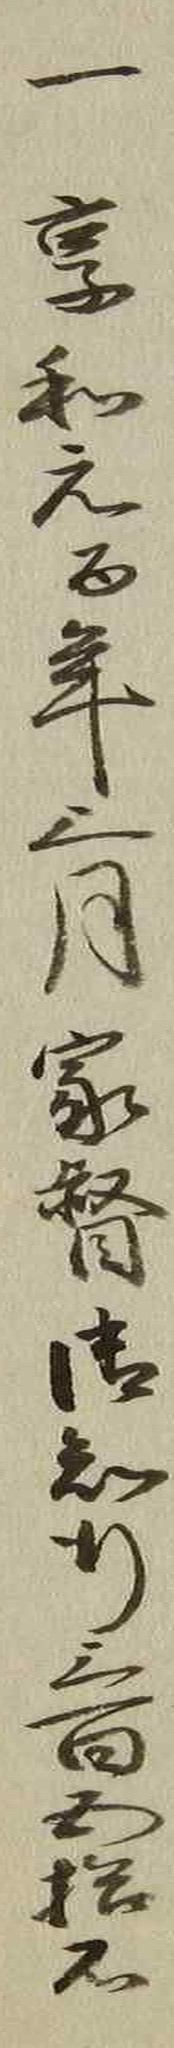一享和元酉年三月家督御知行三百五拾石
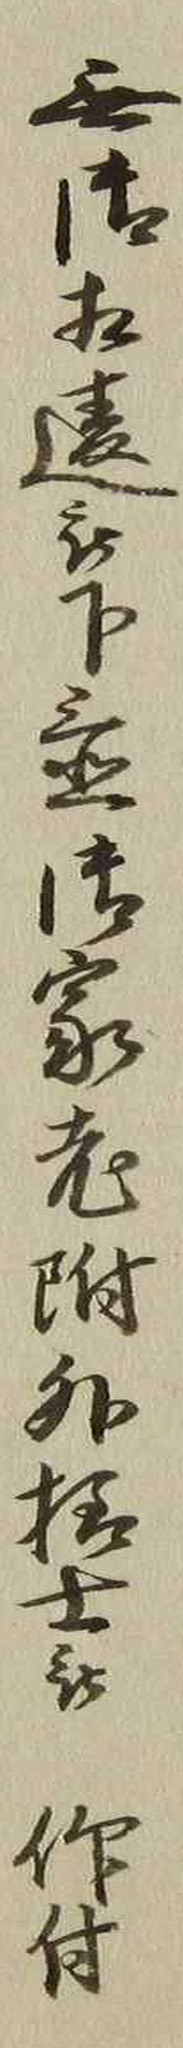無御相違被下置御家老附外様士被仰付
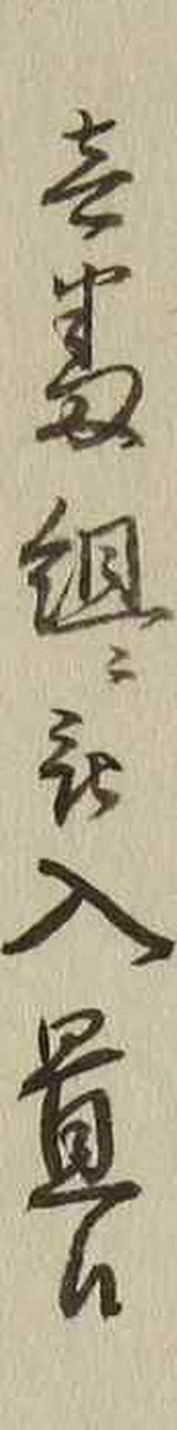壱番組に被入置候
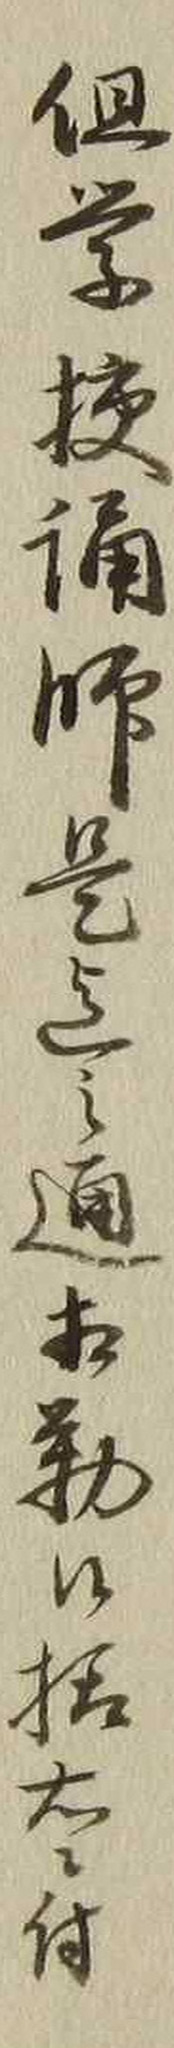但学校誦師是迄之通相勤候様右に付
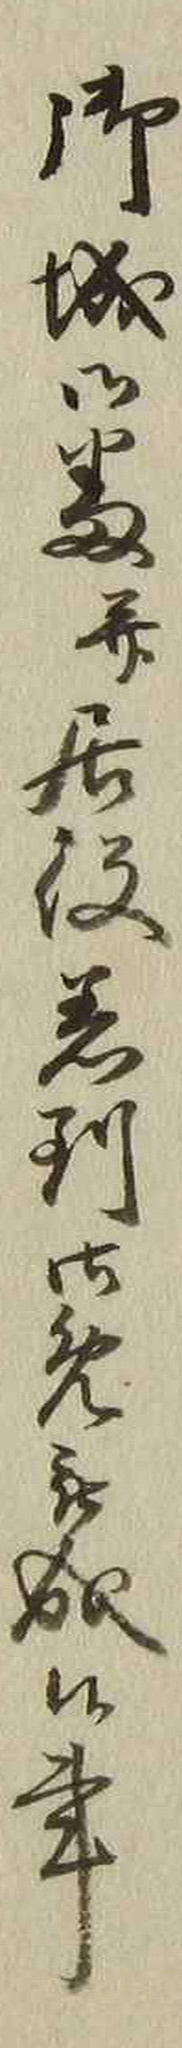御城御番并居役着判御免被成候事
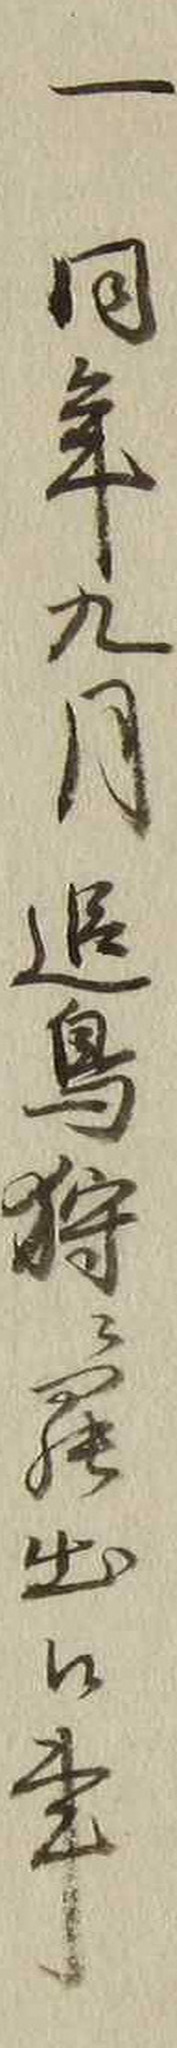一同年九月追鳥狩に罷出候事
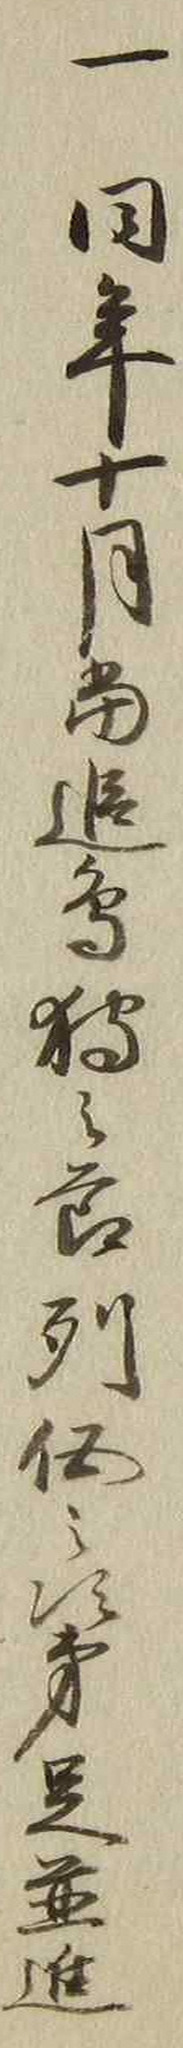一同年十月当追鳥狩之節列伍之次弟足並進
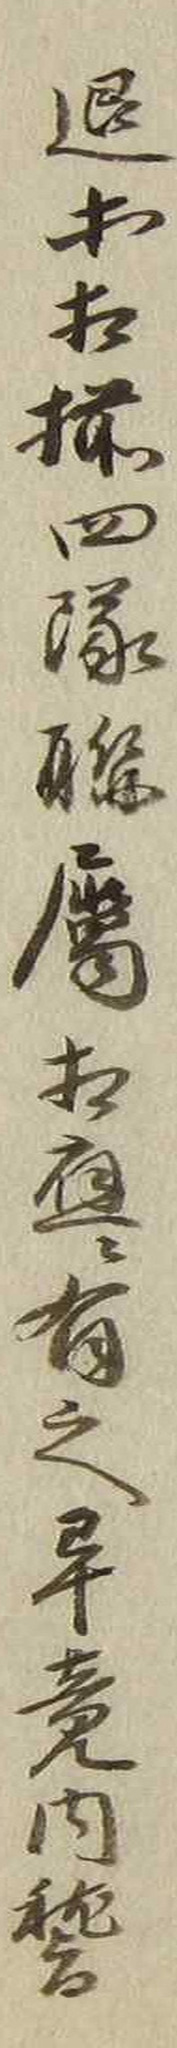退等相揃四隊聯属相応に有之畢竟内稽
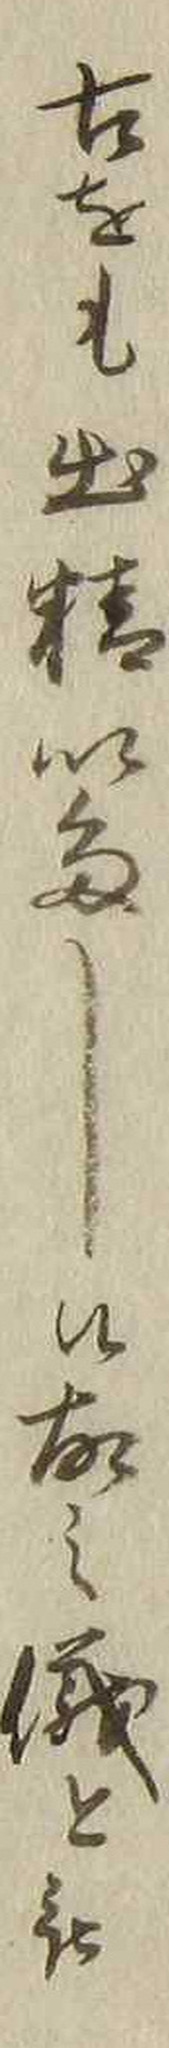古をも出精いたし候故之儀と被
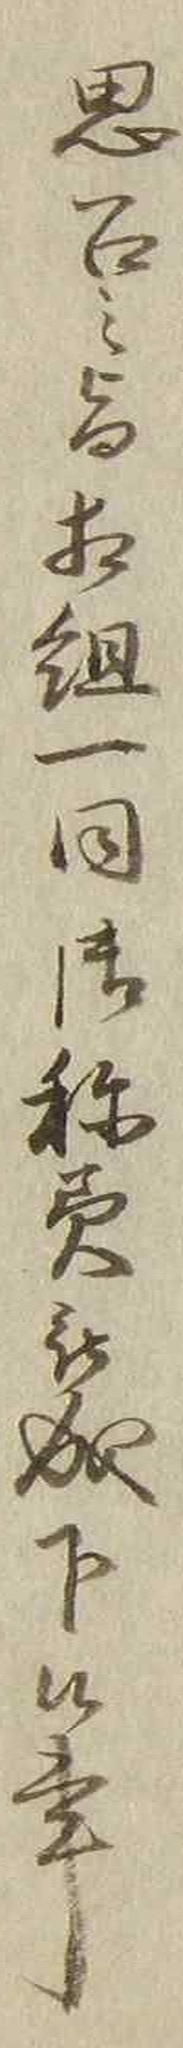思召之旨相組一同御称美被成下候事
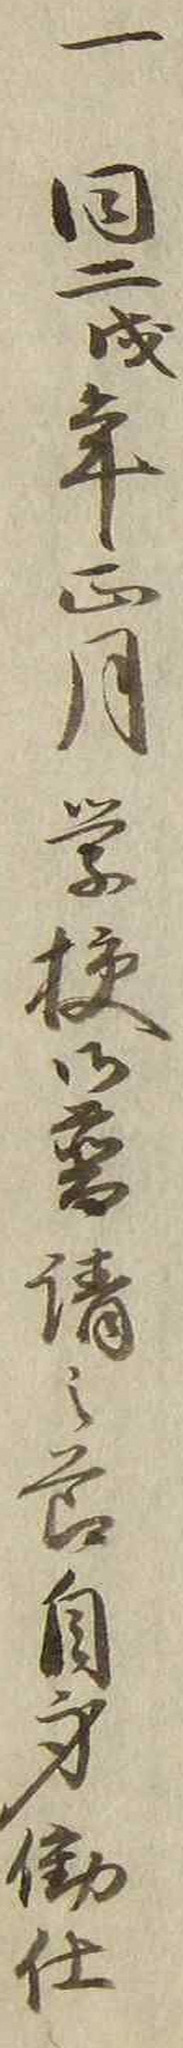一同二成年正月学校御普請之節自身働仕

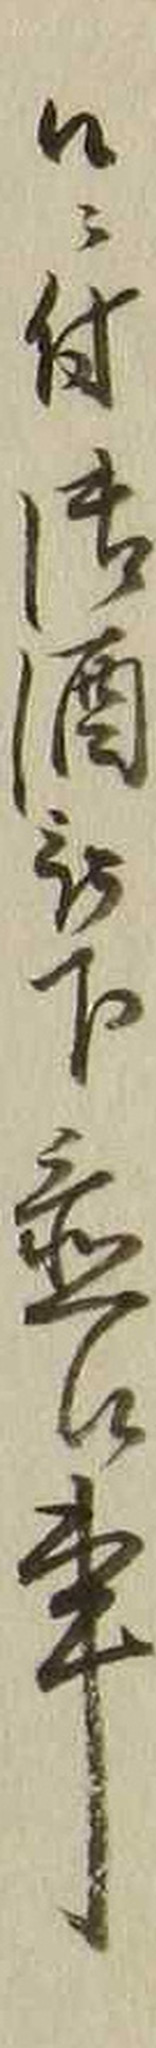候に付御酒被下置候事
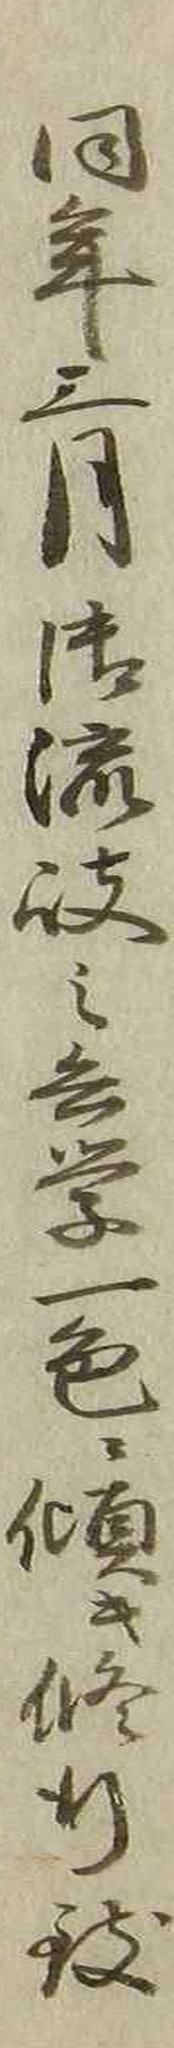一同年三月御流岐之兵学一色に傾き修行致
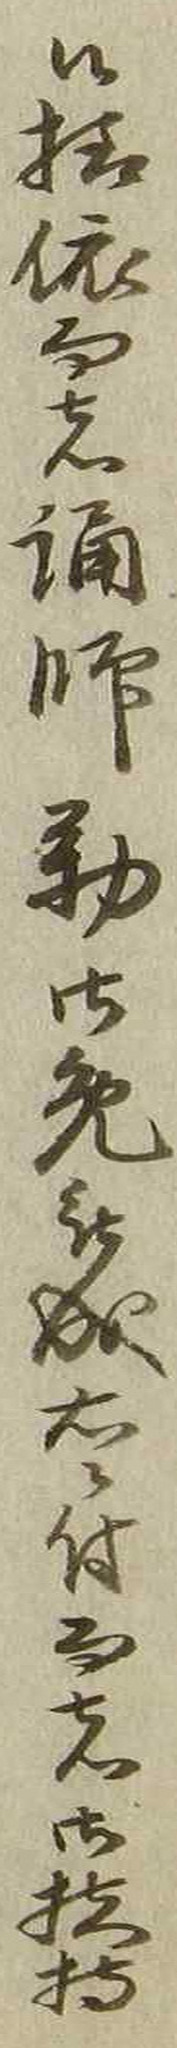候様依而者誦師勤御免被成右に付而者御扶持
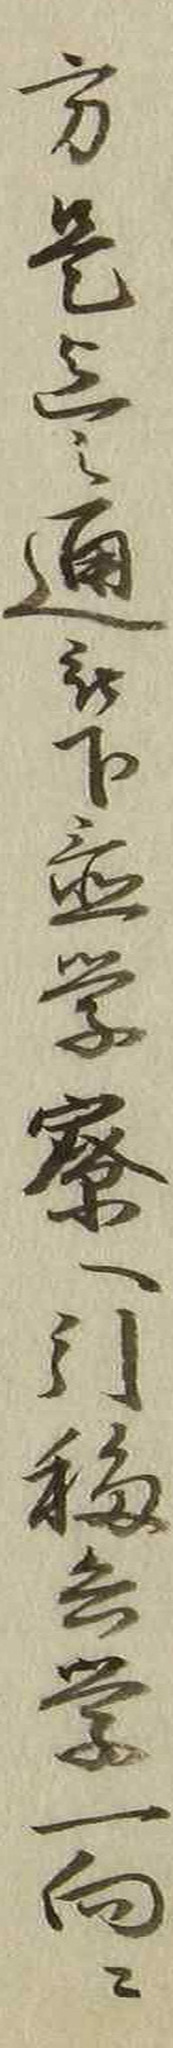方是迄之通被下置学寮へ引移兵学一向に
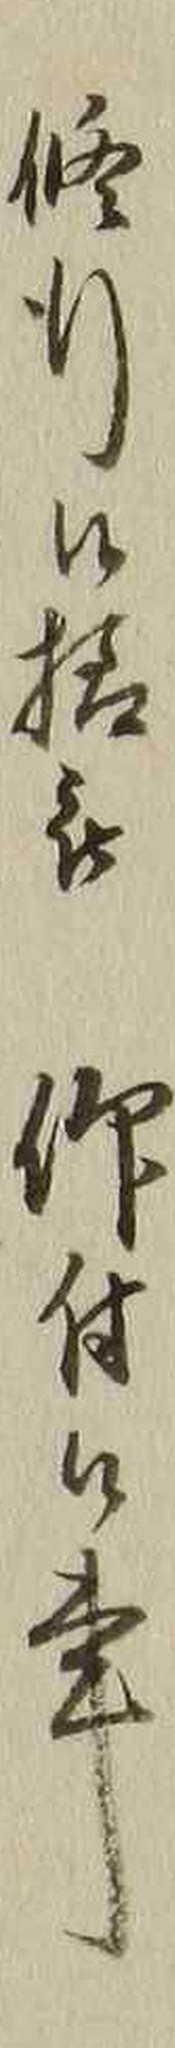修行候様被仰付候事
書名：諸士系譜　巻之133　た之部9
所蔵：会津若松市立会津図書館
